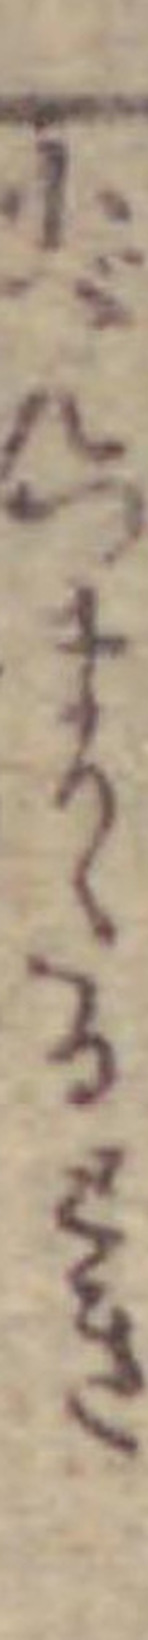小べんつまりたるとき
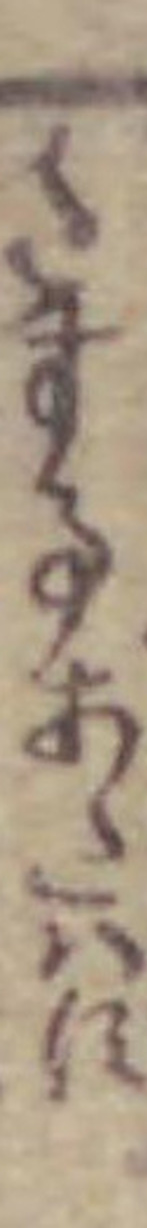たす事あたはず
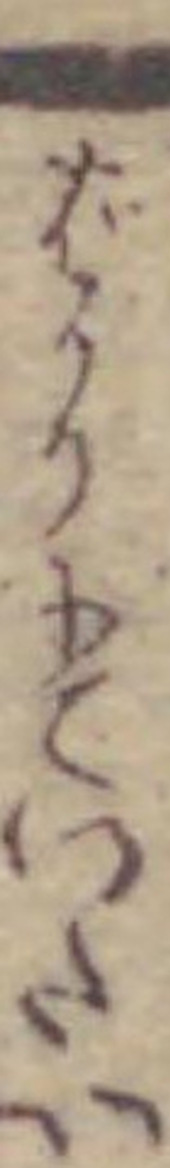ばかりにていた
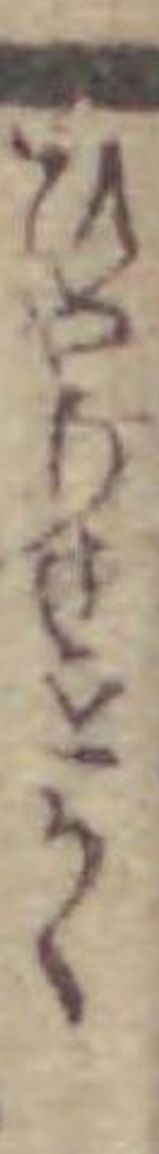ひやあせをかく
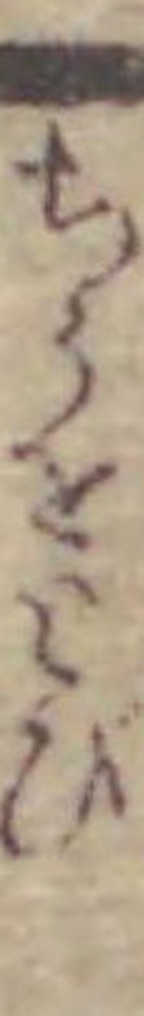ちうをとび
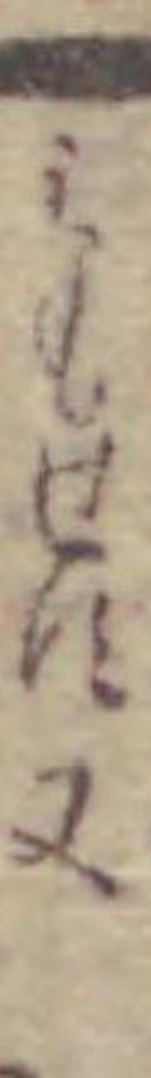みもせず又
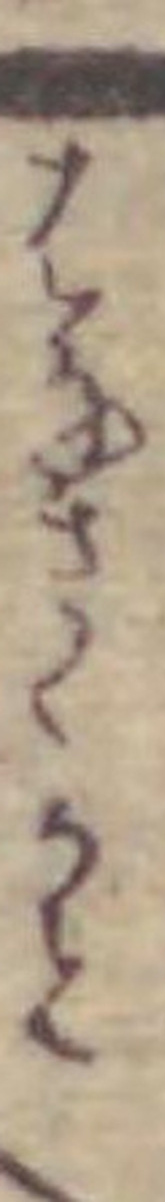はなさくかと
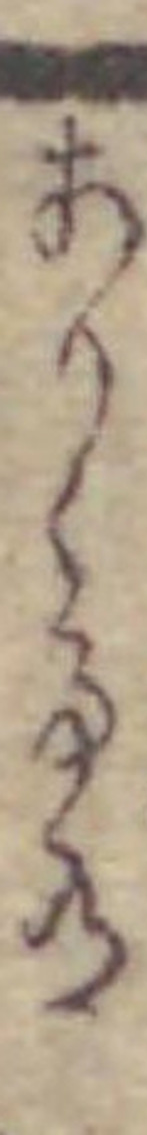ありく事有
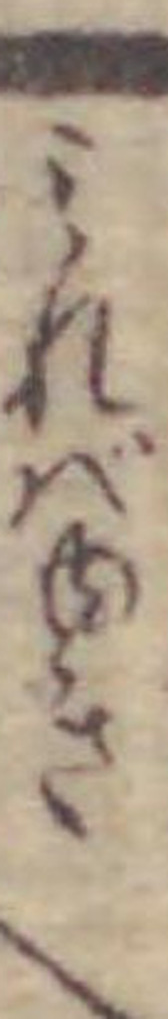みればゆき
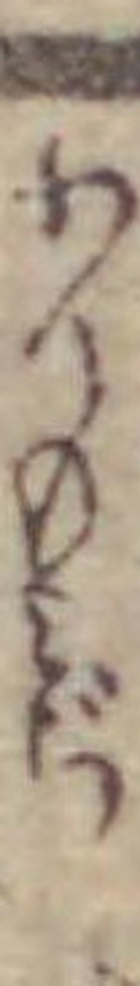ふりもみぢ
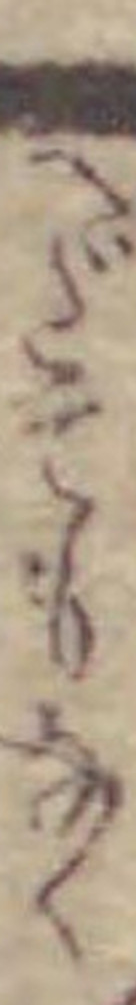へだてもなく
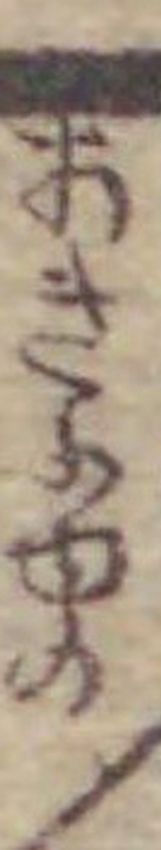あきふゆの
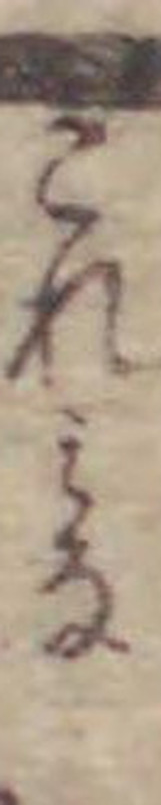これみな
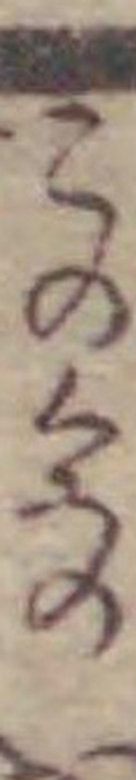このくにの
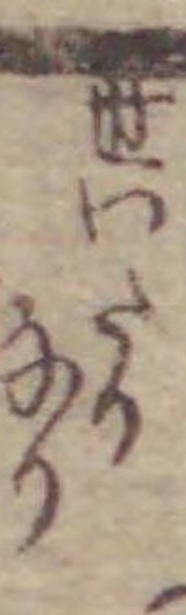世わたり

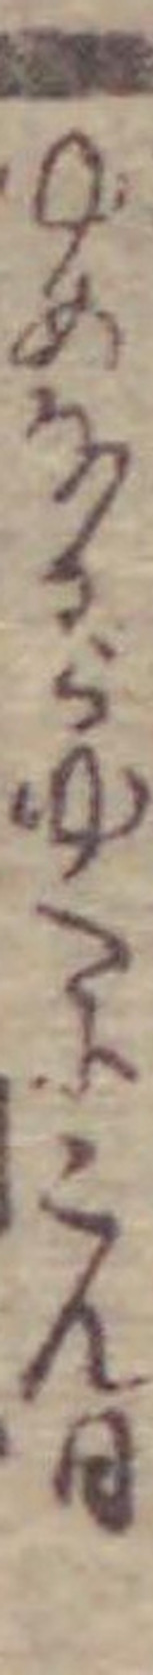ゆめなるがゆへにこん日
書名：和荘兵衛後日話 : 3巻
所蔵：国立国会図書館 National Diet Library, JAPAN
